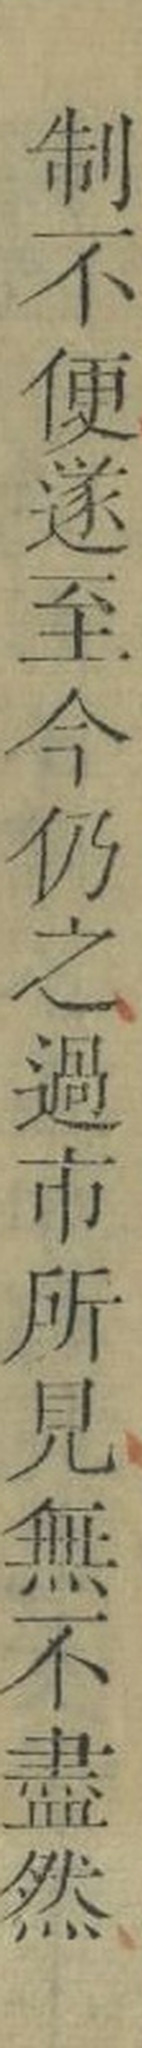制不便遂至今仍之過市所見無不尽然
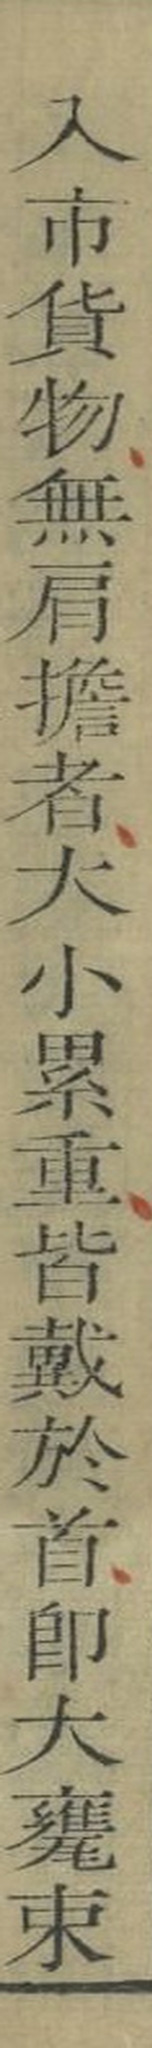入市貨物無肩担者大小累重皆戴於首即大甕束
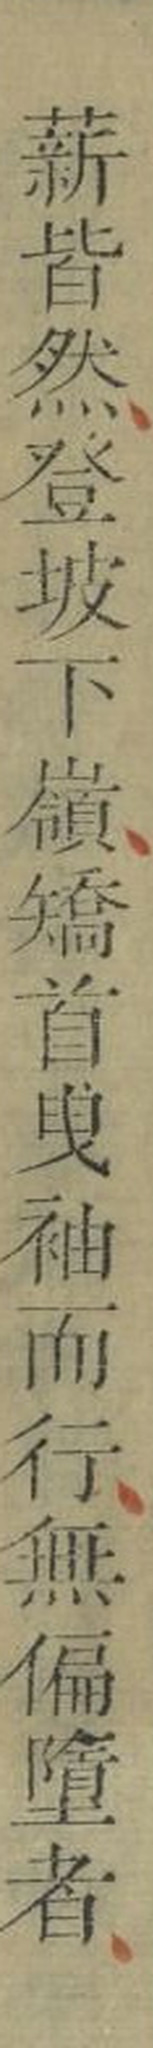薪皆然登坡下嶺矯首曳袖而行無偏墮者
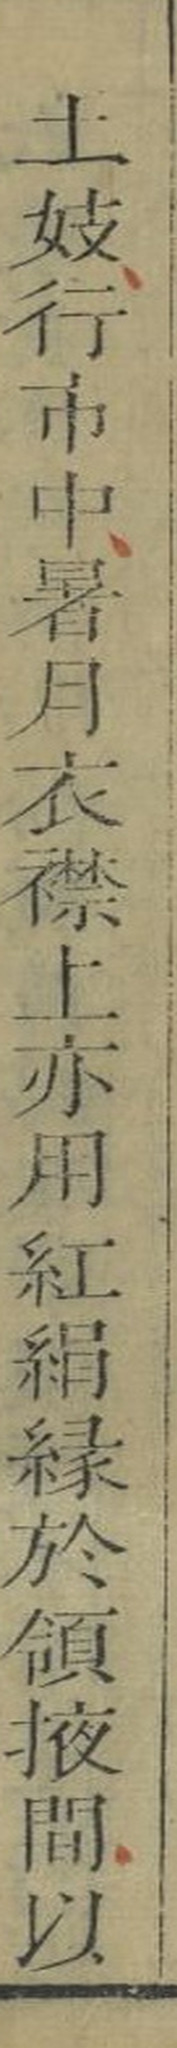土妓行市中暑月衣襟上亦用紅絹縁於領掖間以
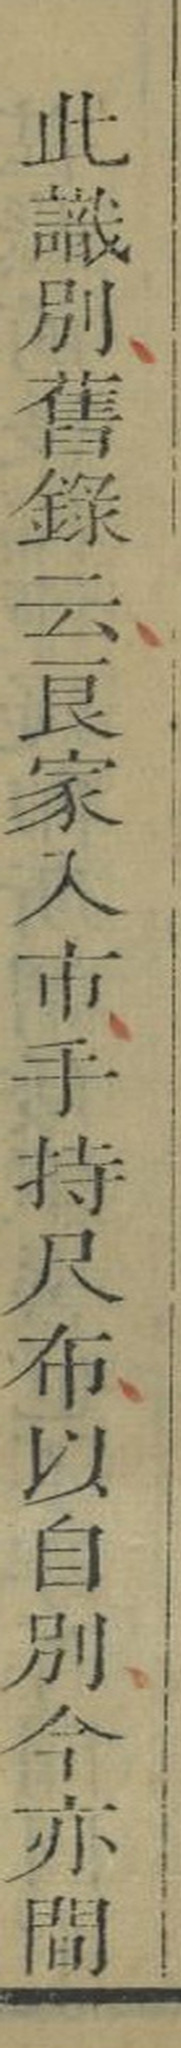此識別旧録云良家入市手持尺布以自別今亦間
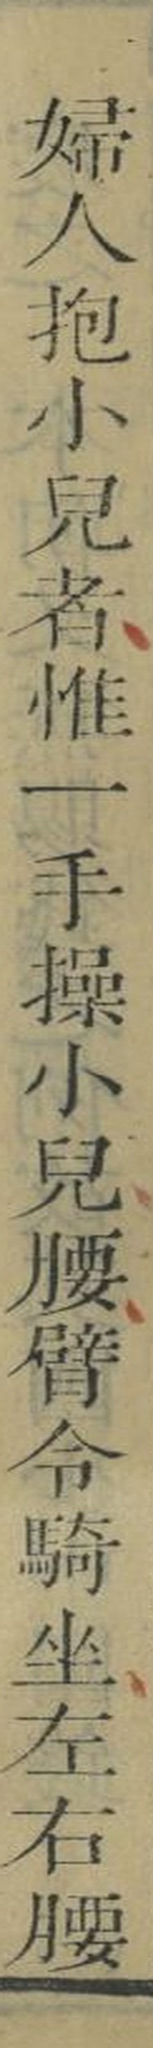婦人抱小児者惟一手操小児腰臂令騎坐左右腰
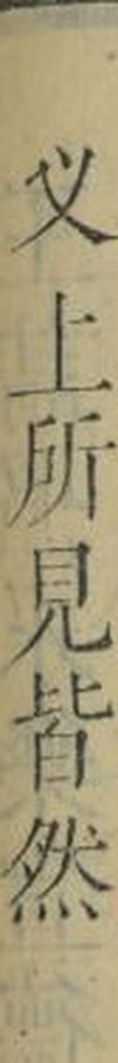又上所見皆然
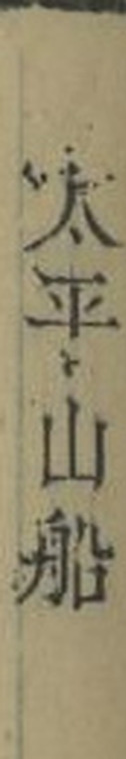太平山船
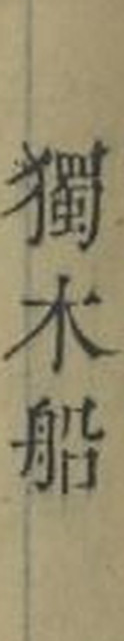独木船

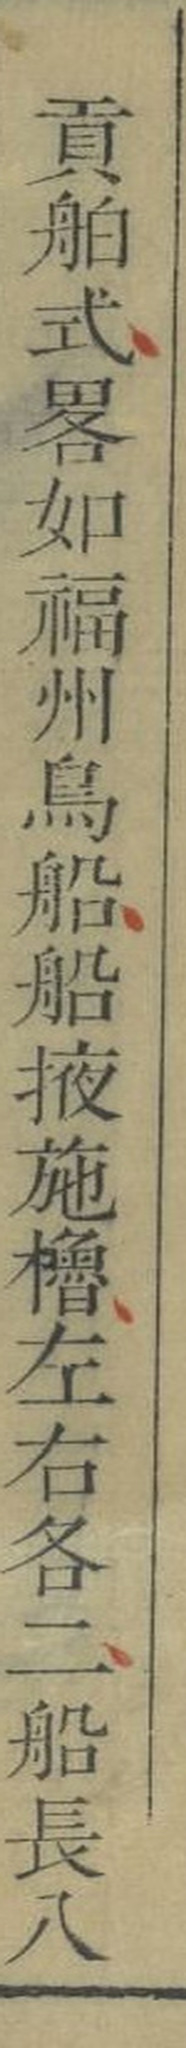貢舶式略如福州鳥船船掖施櫓左右各二船長八
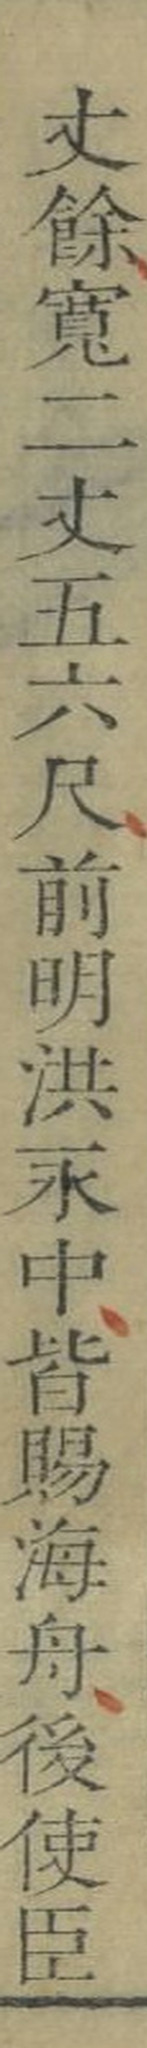丈余寛二丈五六尺前明洪永中皆賜海舟後使臣
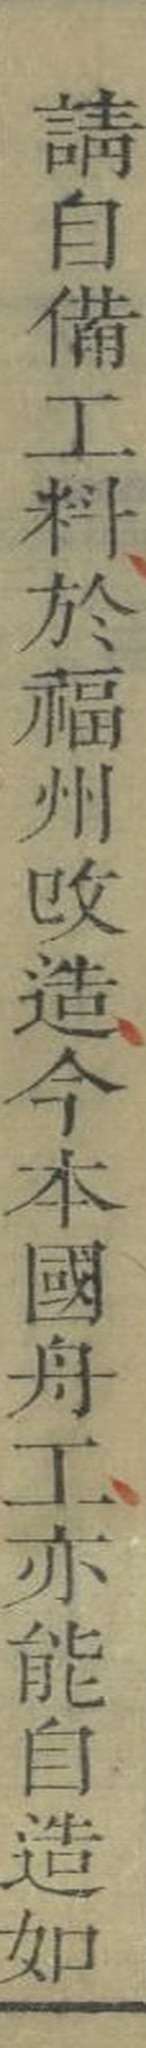請自備工料於福州改造今本国舟工亦能自造如
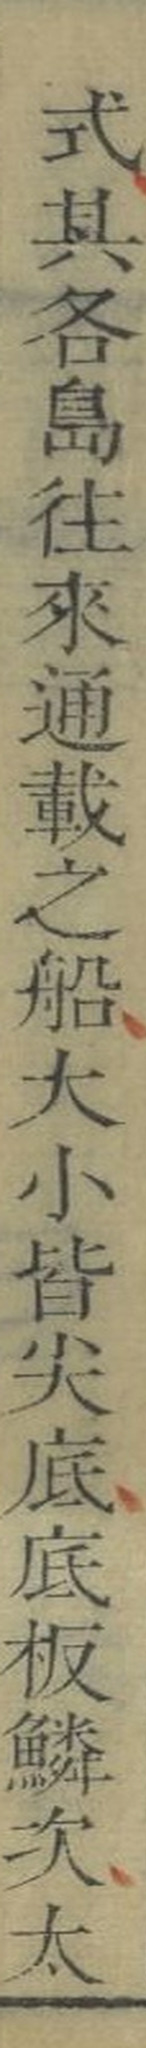式其各島往来通載之船大小皆尖底底板鱗次太
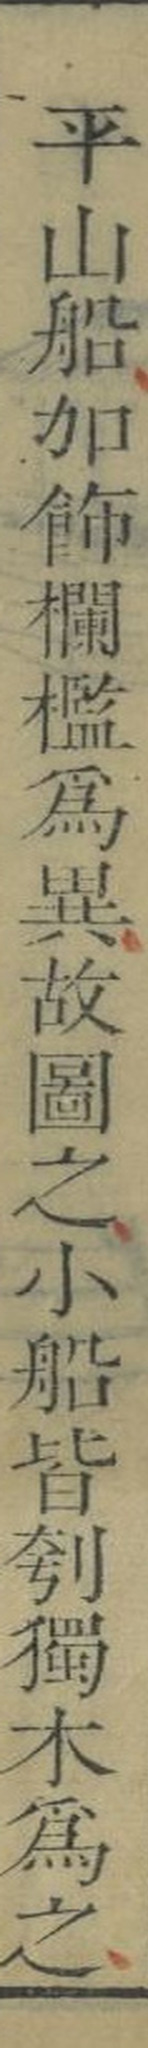平山船加飾欄檻為異故図之小船皆刳独木為之
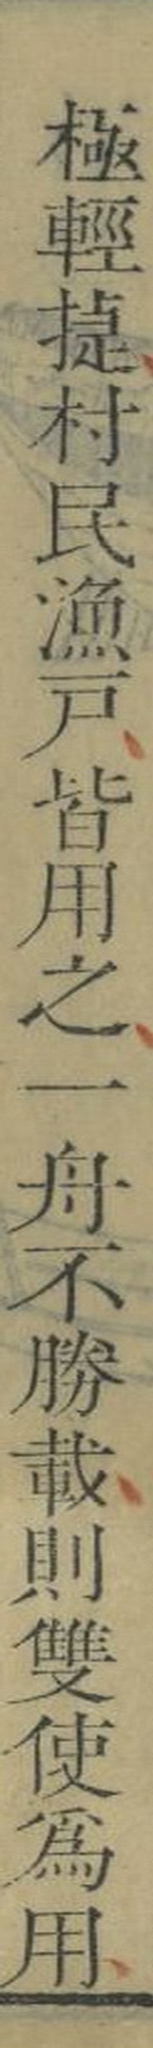極軽㨗村民漁戸皆用之一舟不勝載則双使為用

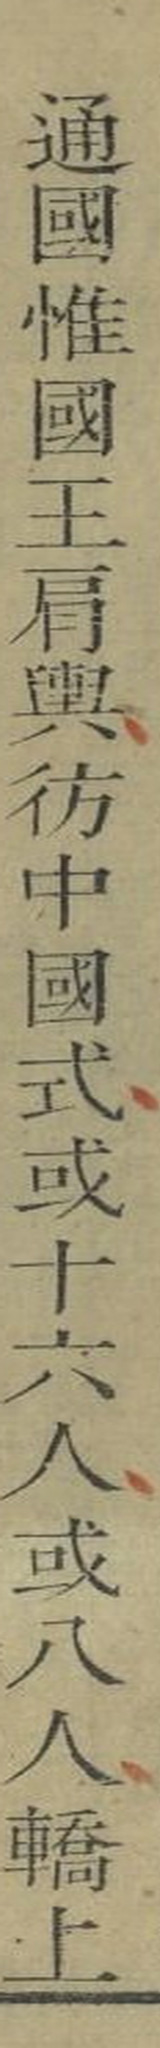通国惟国王肩輿彷中国式或十六人或八人轎上
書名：中山伝信録 巻六
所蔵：University of the Ryukyus Library
